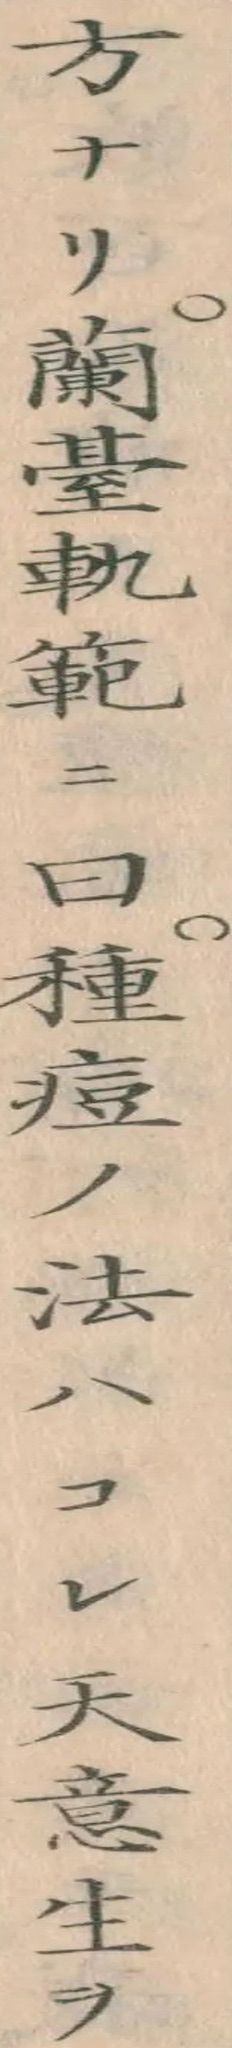方ナリ。蘭台軌範ニ曰。種痘ノ法ハコレ天意生ヲ
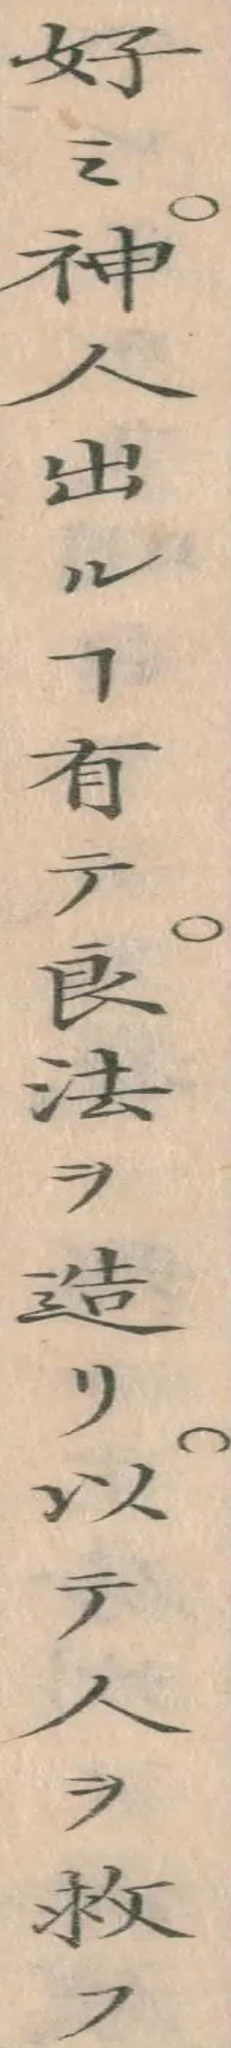好ミ。神人出ルヿ有テ。良法ヲ造リ。以テ人ヲ救フ
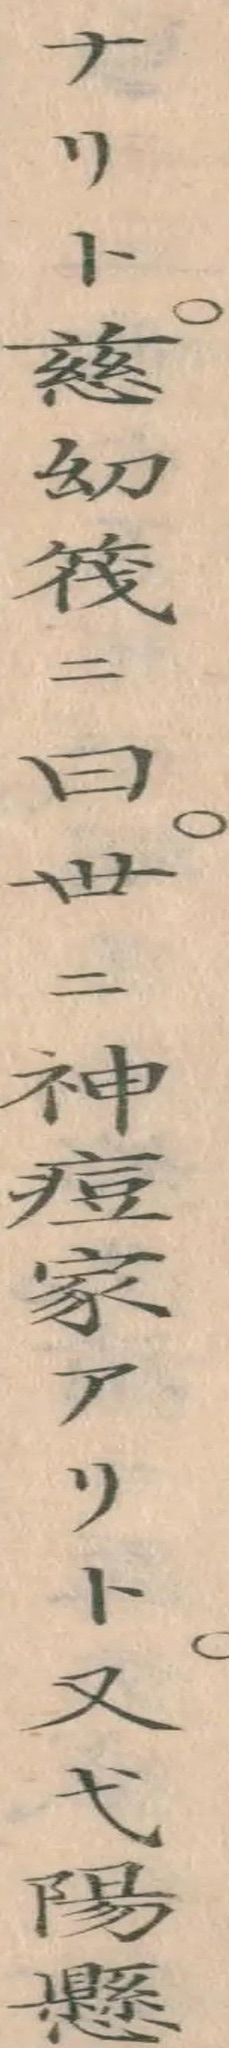ナリト。慈幼筏ニ曰。世ニ神痘家アリト。又弋陽懸
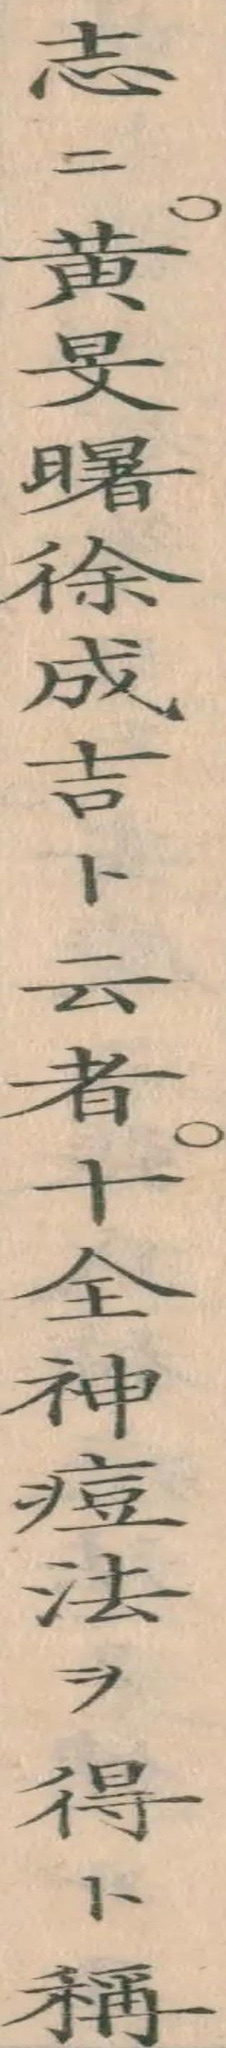志ニ。黄旻曙徐成吉ト云者。十全神痘法ヲ得ト称
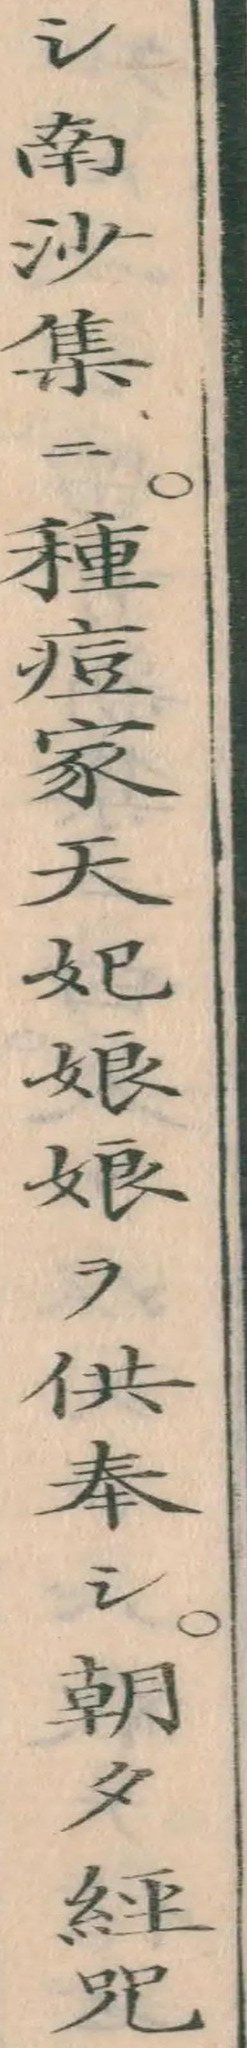シ南沙集ニ。種痘家天妃娘娘ヲ供奉シ。朝夕経咒
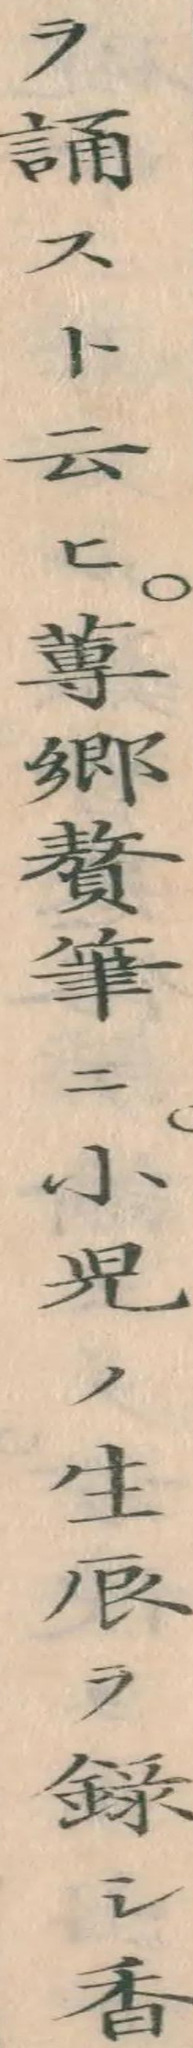ヲ誦スト云ヒ。蓴郷贅筆ニ。小児ノ生辰ヲ録シ香
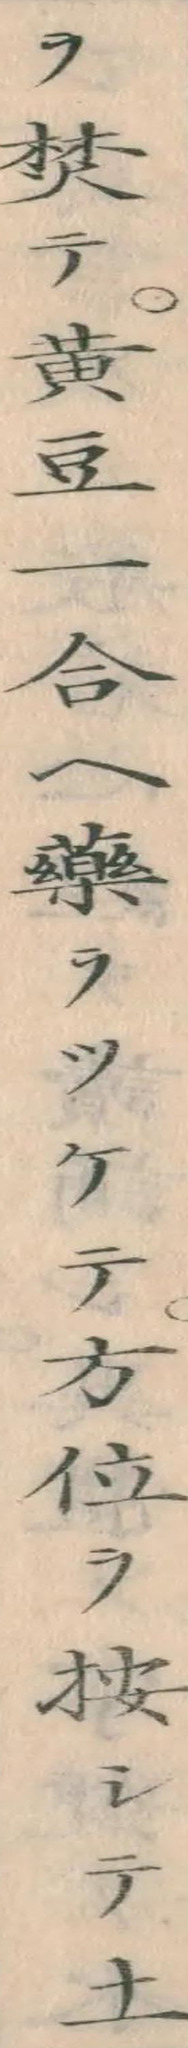ヲ焚テ。黄豆一合ヘ薬ヲツケテ。方位ヲ按シテ土
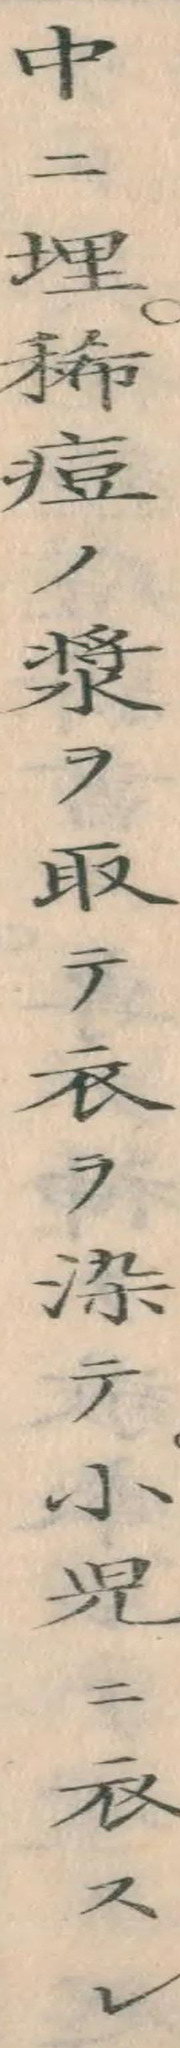中ニ埋。種痘ノ漿ヲ取テ衣ヲ染テ。小児ニ衣スレ
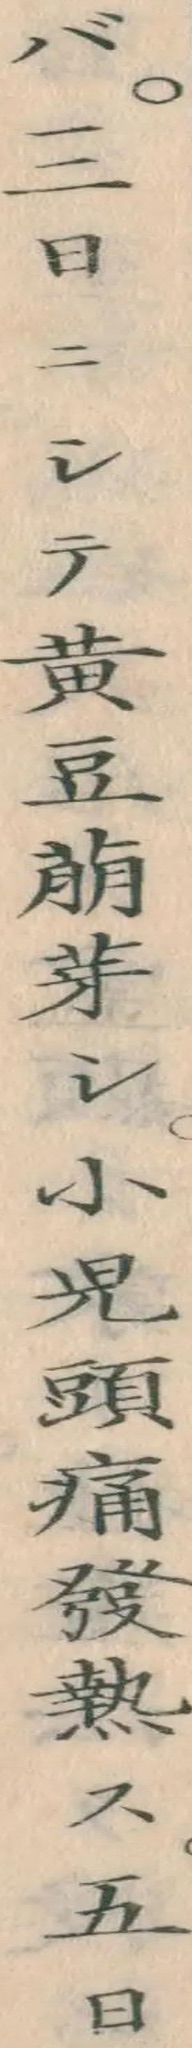バ。三日ニシテ黄豆萌芽シ。小児頭痛発熱ス。五日
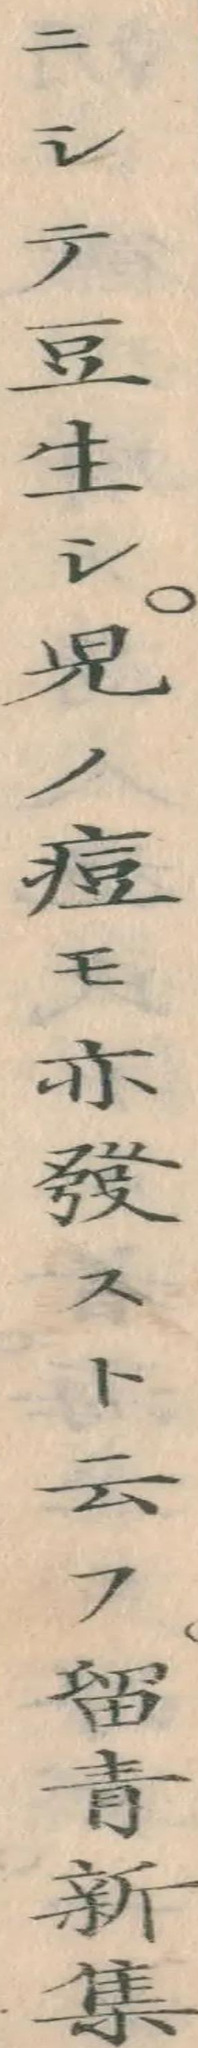ニシテ豆生シ。児ノ痘モ亦発スト云フ。留青新集
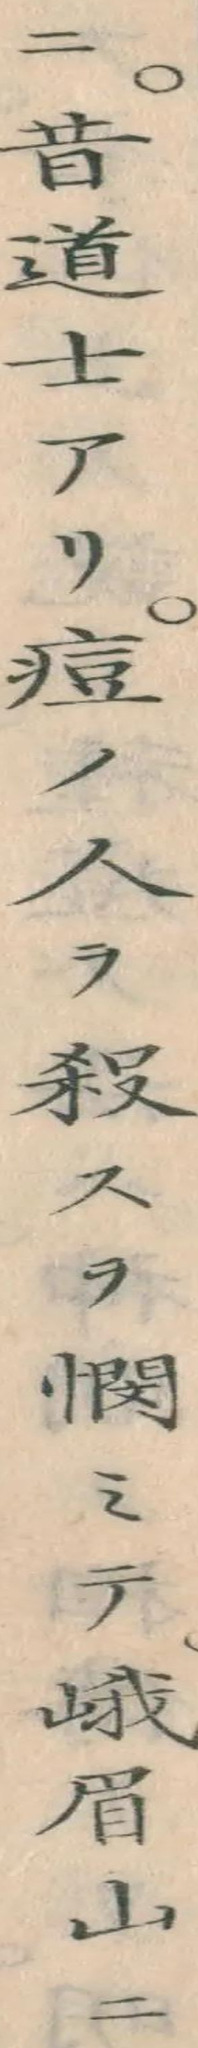ニ。昔道士アリ。痘ノ人ヲ殺スヲ憫ミテ。峨眉山ニ
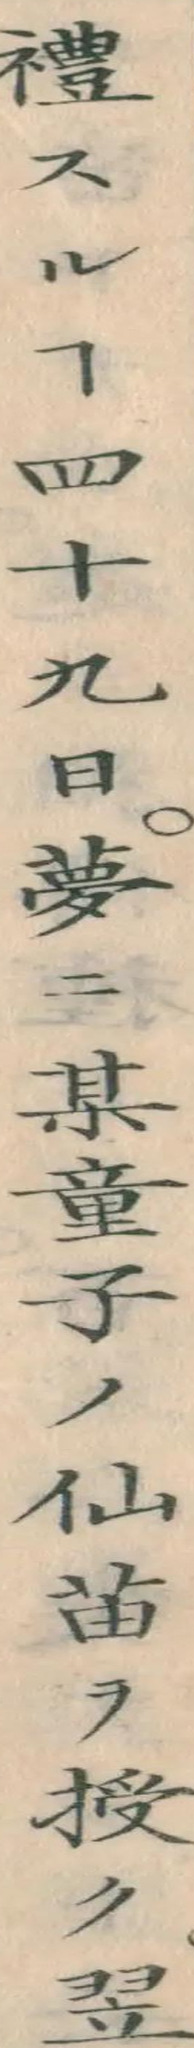礼スルヿ四十九日。夢ニ某童子ノ仙苗ヲ授ク。翌
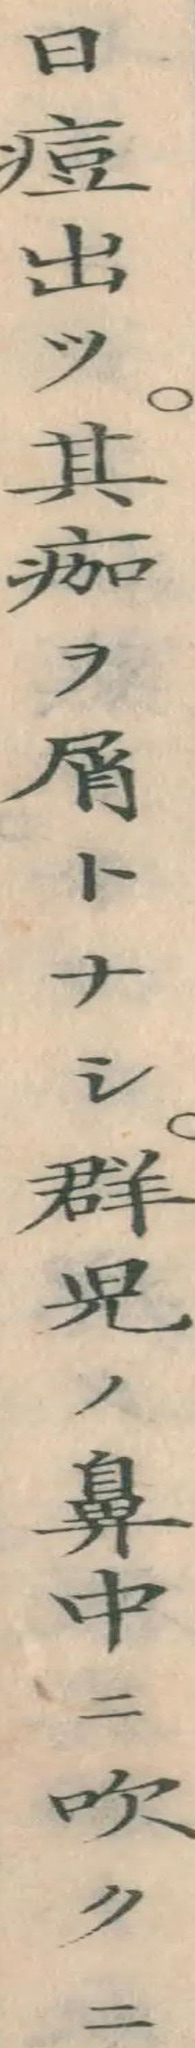日痘出ツ。其痂ヲ屑トナシ。群児ノ鼻中ニ吹クニ。

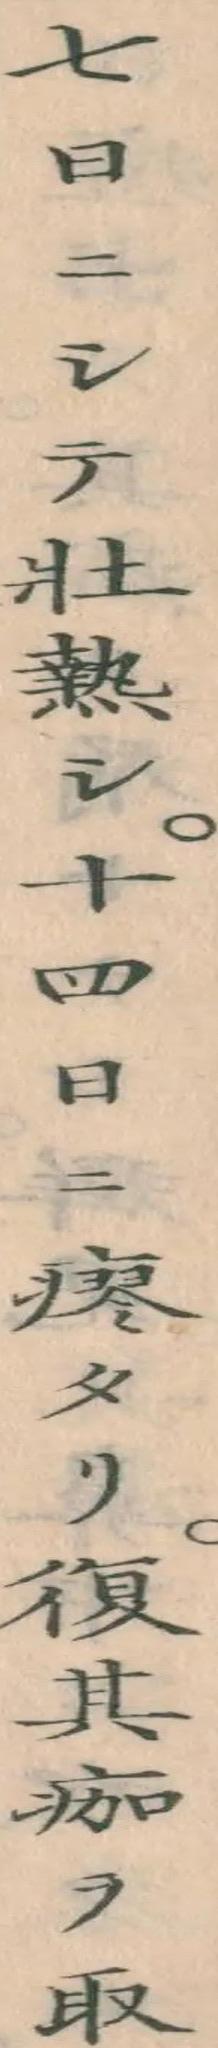七日ニシテ壮熱シ。十四日ニ瘳タリ。復其痂ヲ取
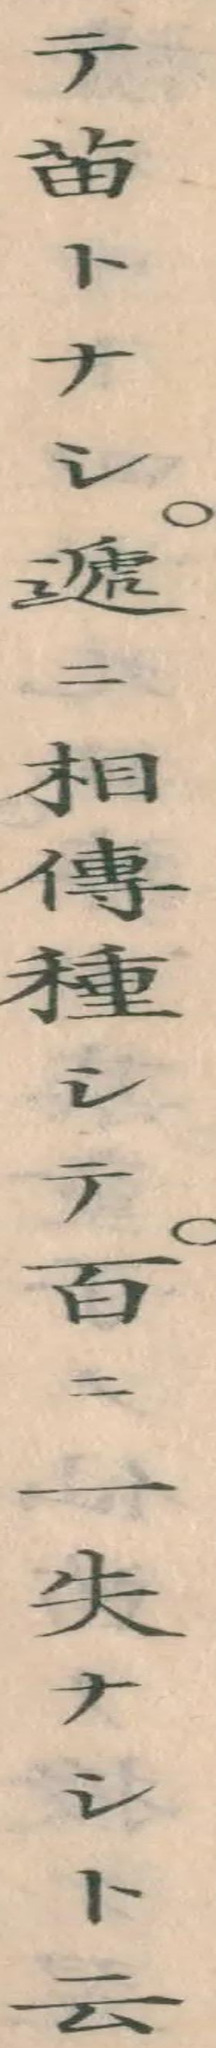テ苗トナシ。逓ニ相伝種シテ。百ニ一失ナシト云
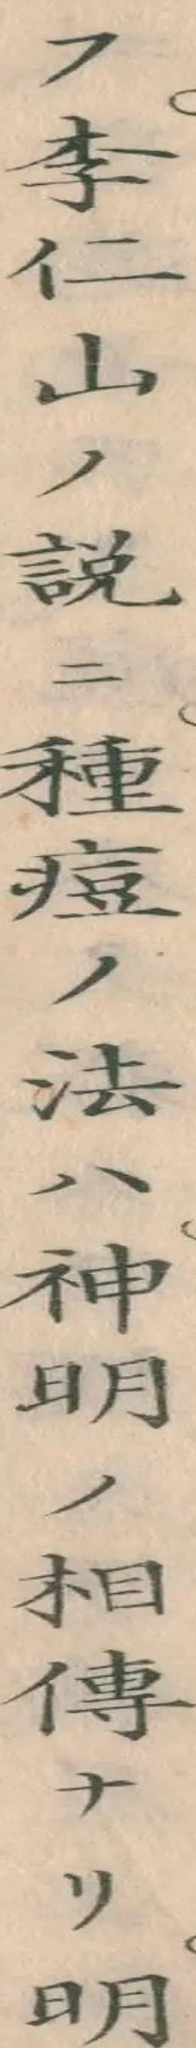フ。李仁山ノ説ニ。種痘ノ法ハ。神明ノ相伝ナリ。明
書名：種痘弁義
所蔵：国立国会図書館 National Diet Library, JAPAN
